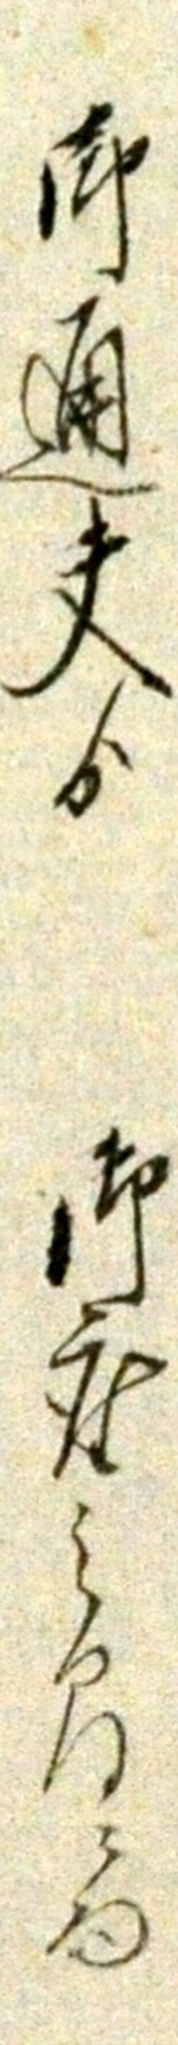御通夫ゟ御座之間ニ而

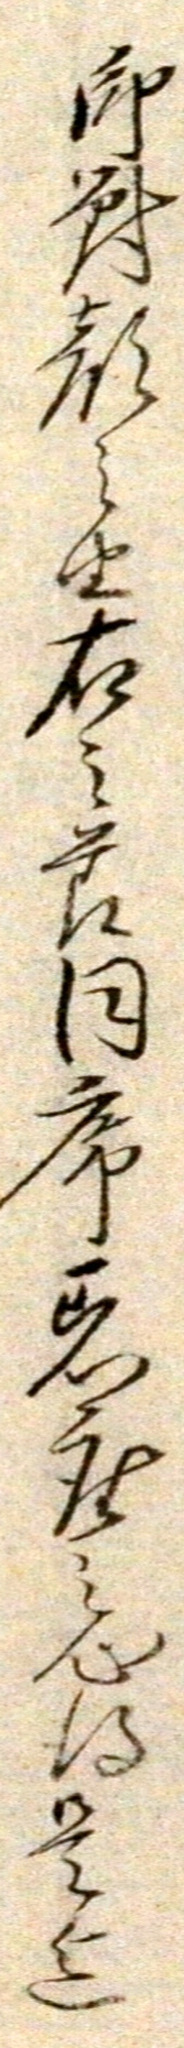御対顔之由右之節同席着座之心得是迄
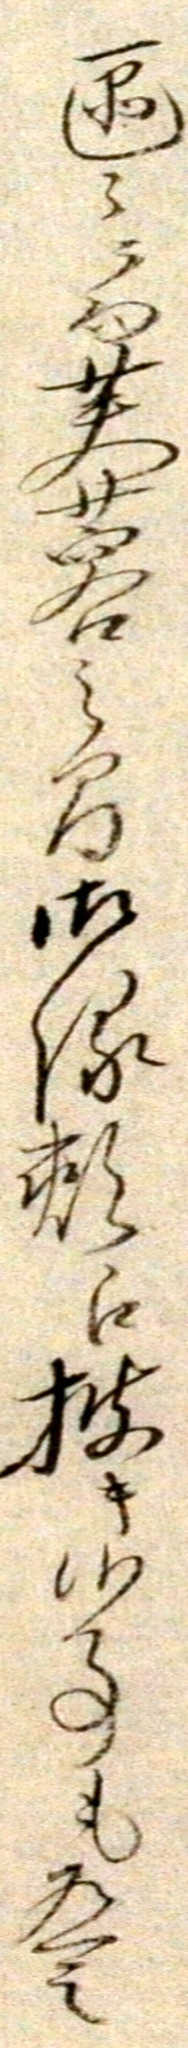区々ニ而芙蓉之間御縁頬え披キ候事も有之
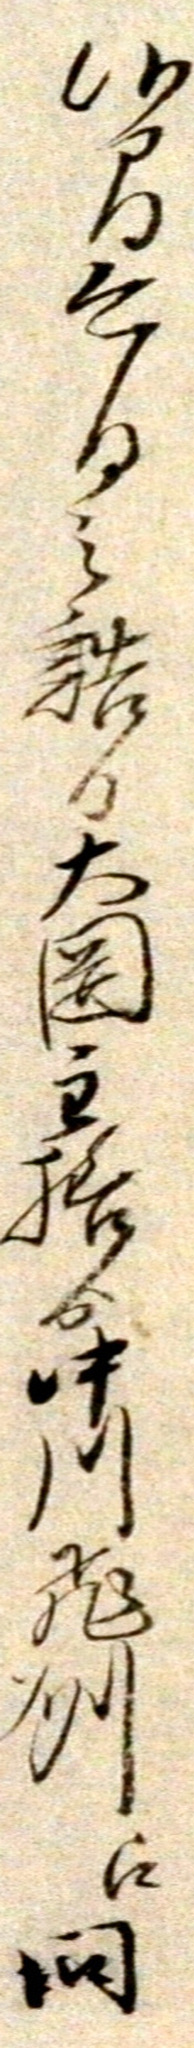候間今日之詰日大岡主膳ゟ中川飛州え問
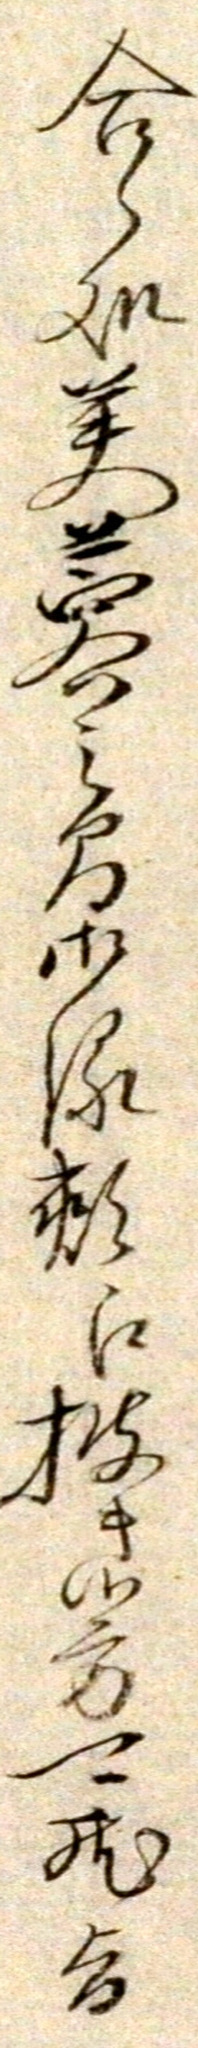合候処芙蓉之間御縁頬え披キ候方可然旨
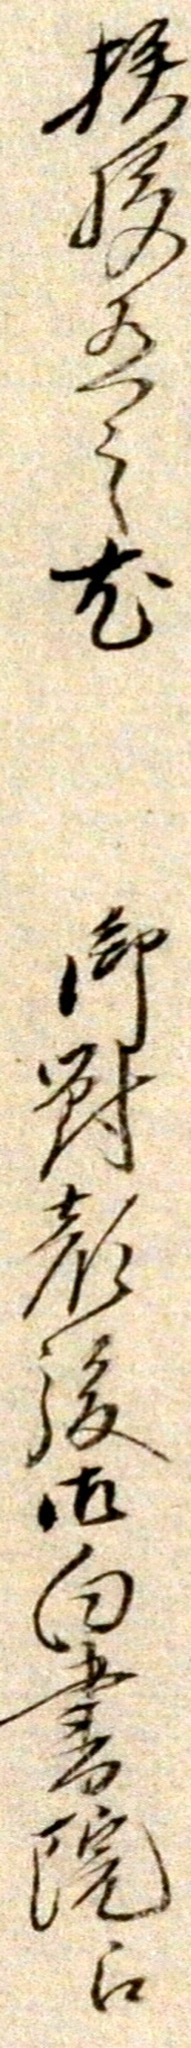挨拶有之尤御対顔後御白書院え
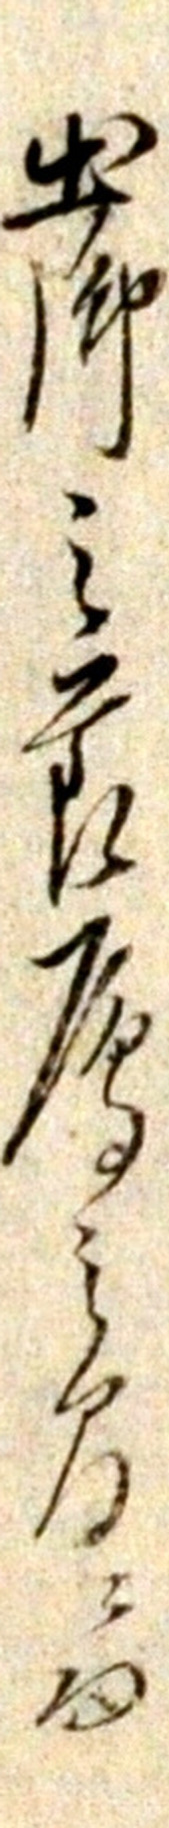出御之節鳫之間ニ而
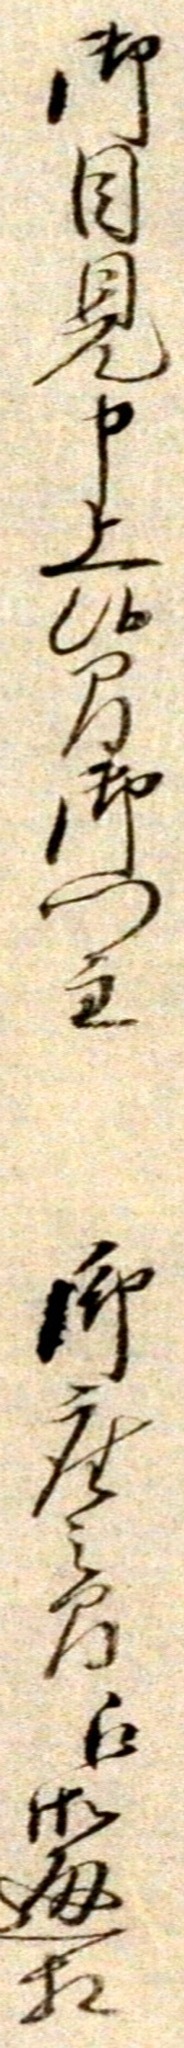御目見申上候間御門主御座之間え御通相
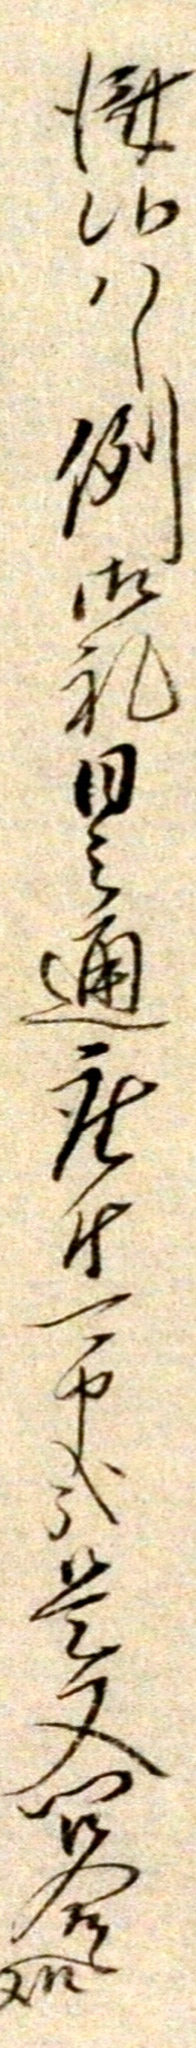済候ハヽ例御礼日之通座付可申哉是又問合候処
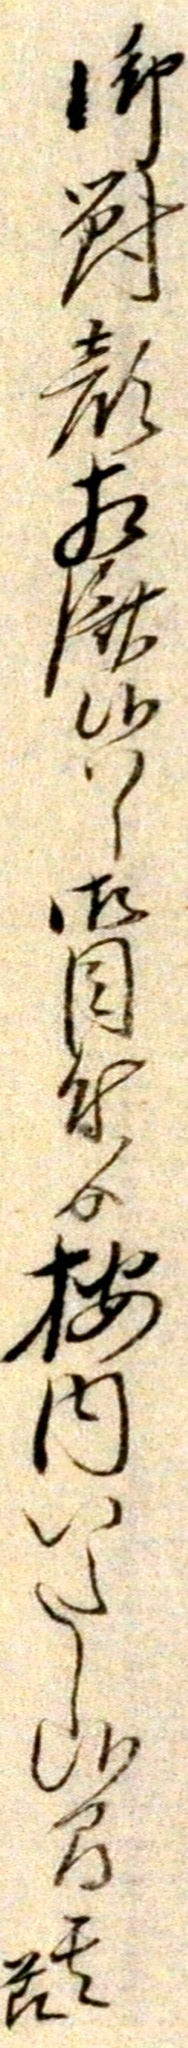御対顔相済候ハヽ御目付ゟ按内いたし候間其節
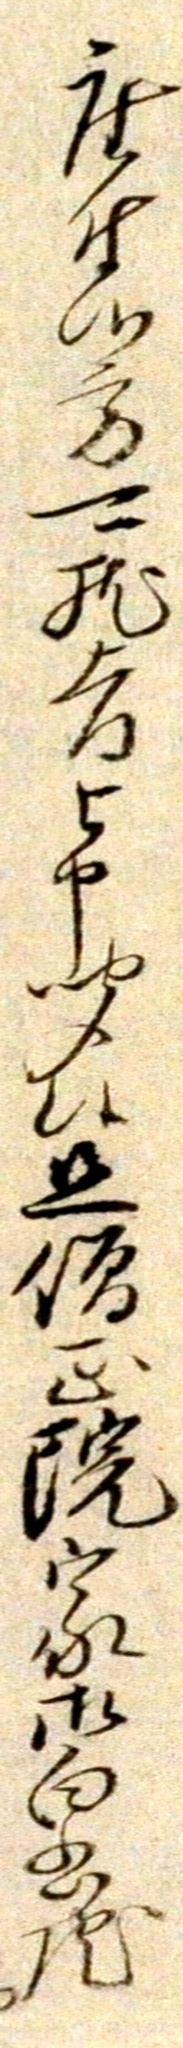座付候方可然旨被申聞候且僧正院家御白書院ニ而
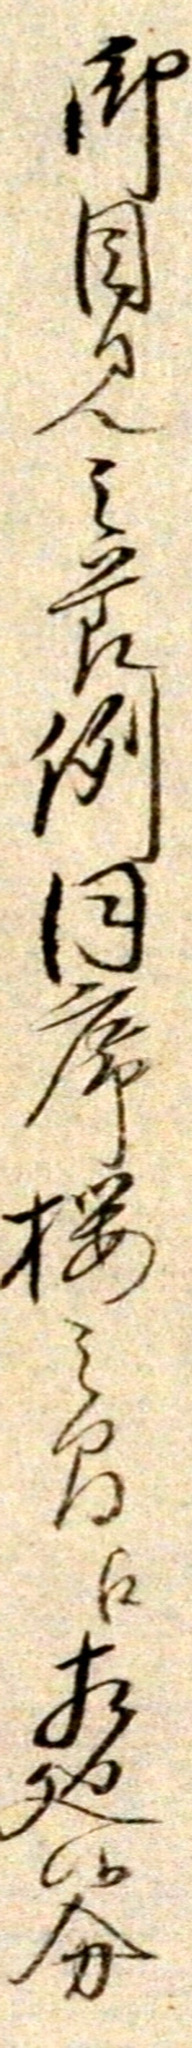御目見之節例同席桜之間え相廻候分
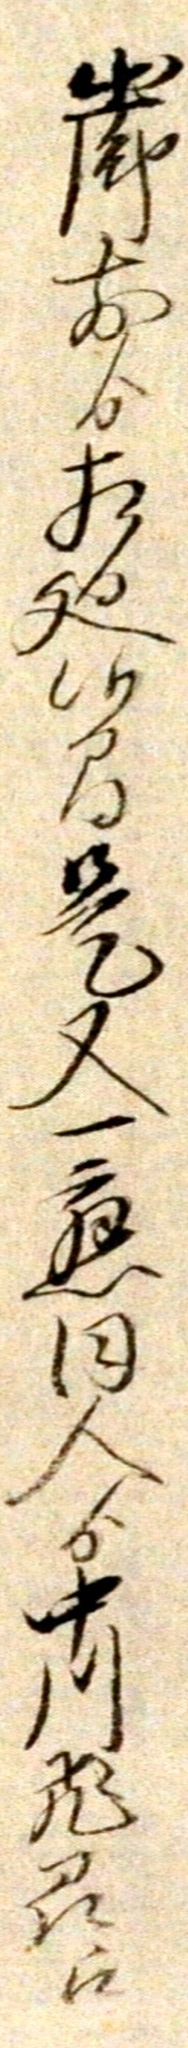出御前ゟ相廻候間是又一応同人ゟ中川飛州え
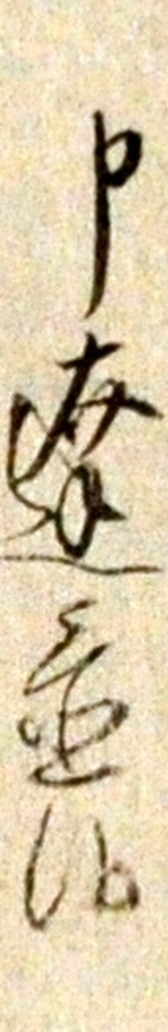申達置候
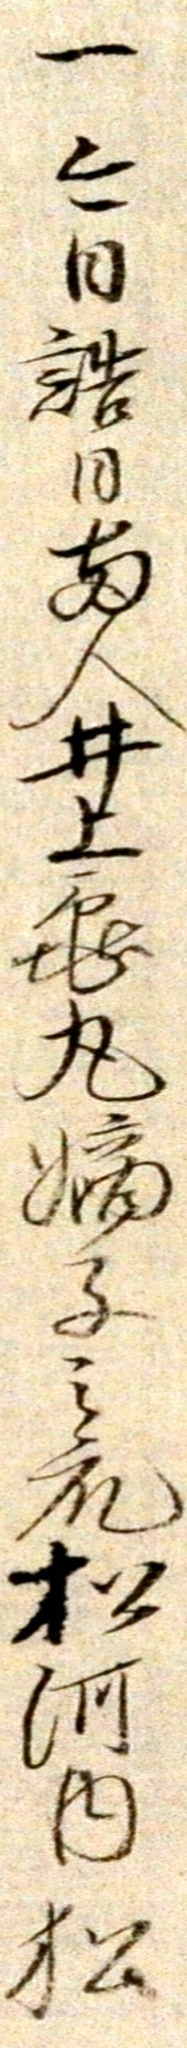一今日詰日両人井上亀丸嫡子之衆松河内松
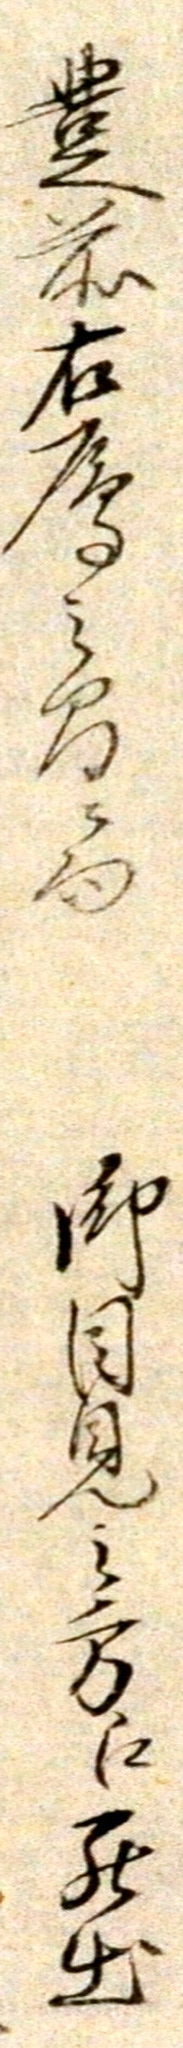豊前右鳫之間ニ而御目見之方え罷出
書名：御座ノ間御修覆中日光御門主御対顔ノ節ノ留
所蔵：伊那市立高遠町図書館・合同会社AMANE
